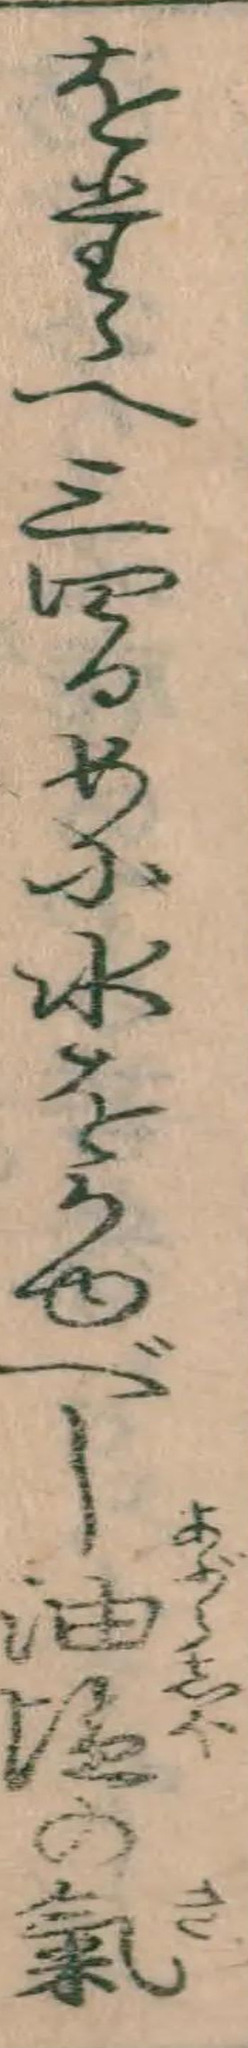をたゝへ三四日めに水をかゆべし油塩の気
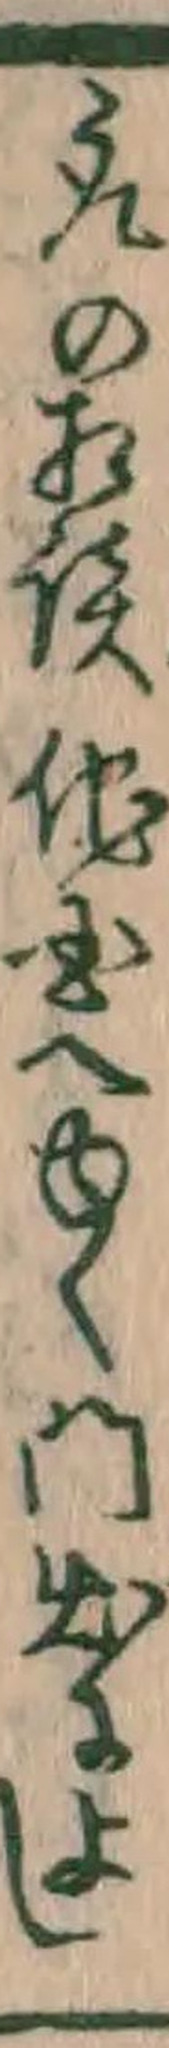取の相談他国へゆく門出によし
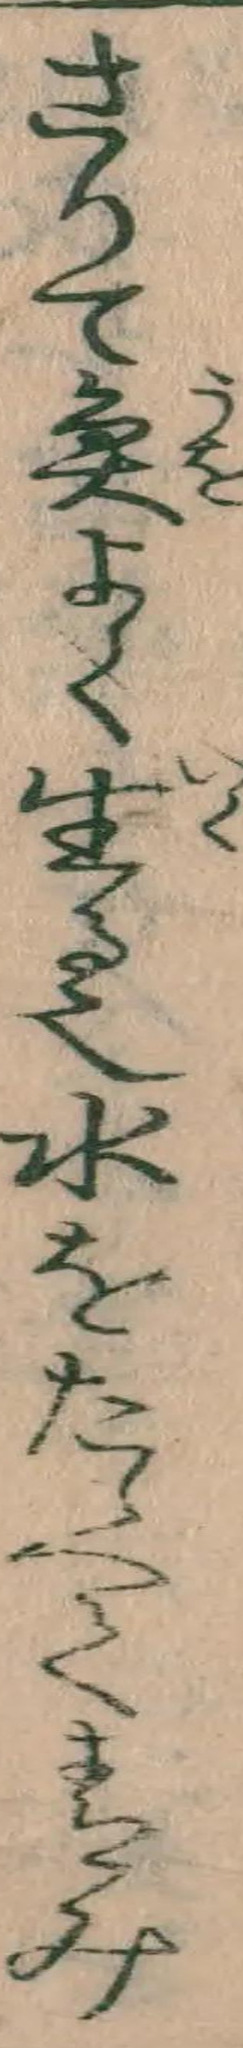さりて魚よく生る也水をたゝへて青み
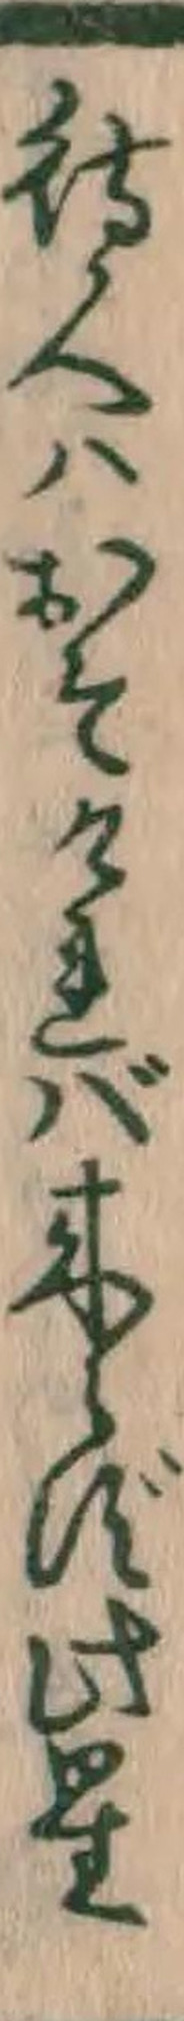待人はおそければ来らず此星
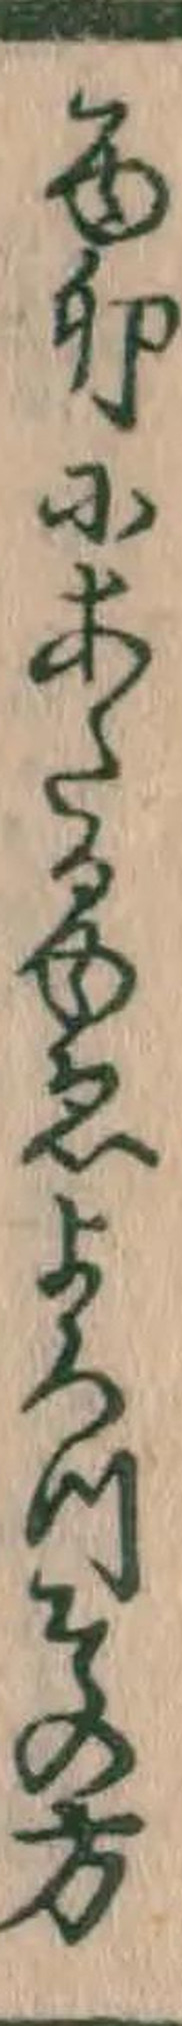酉卯にあたるゆゑよろつその方
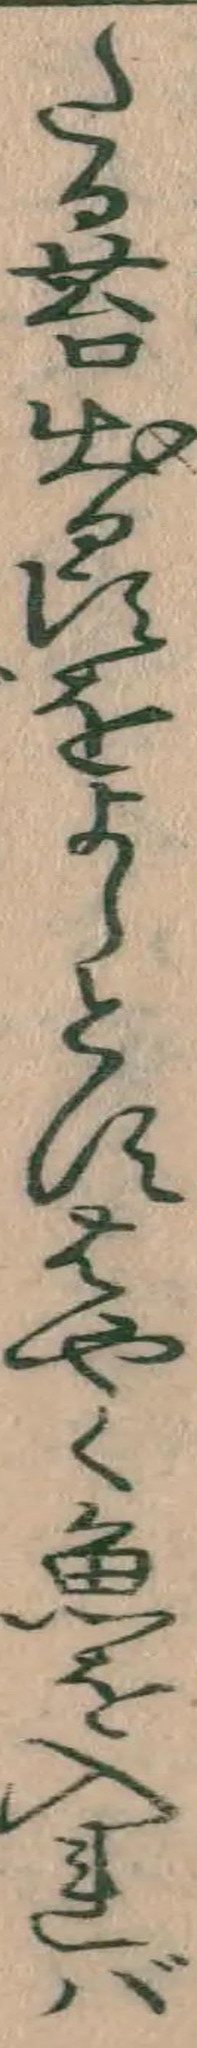たる苔出る頃をよしとすはやく魚を入れば
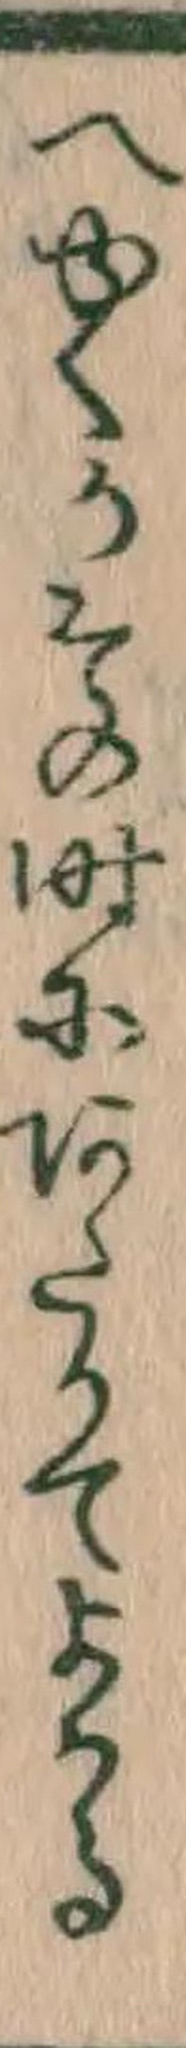へゆくかその時にあたりてよかる
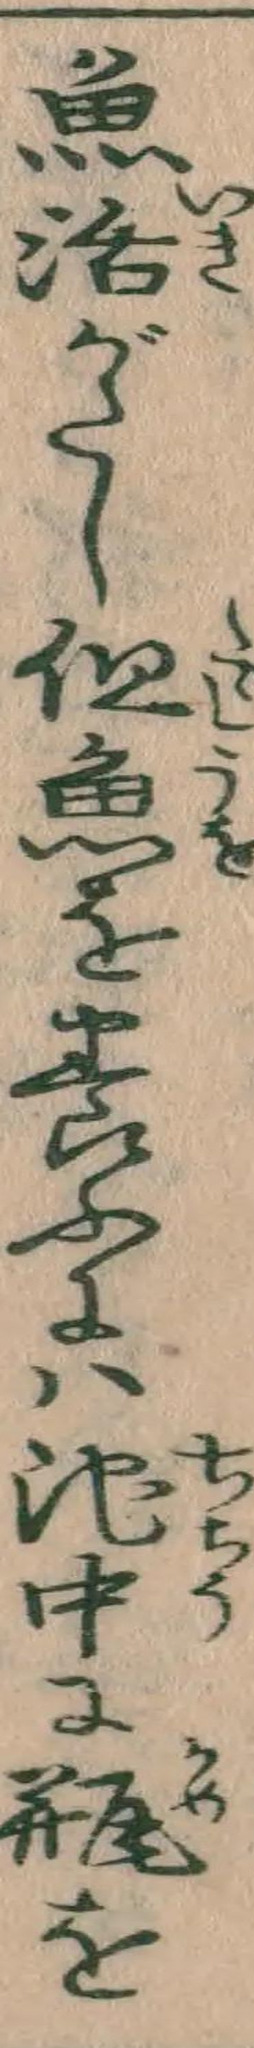魚活がたし但魚を養ふには地中に瓶を
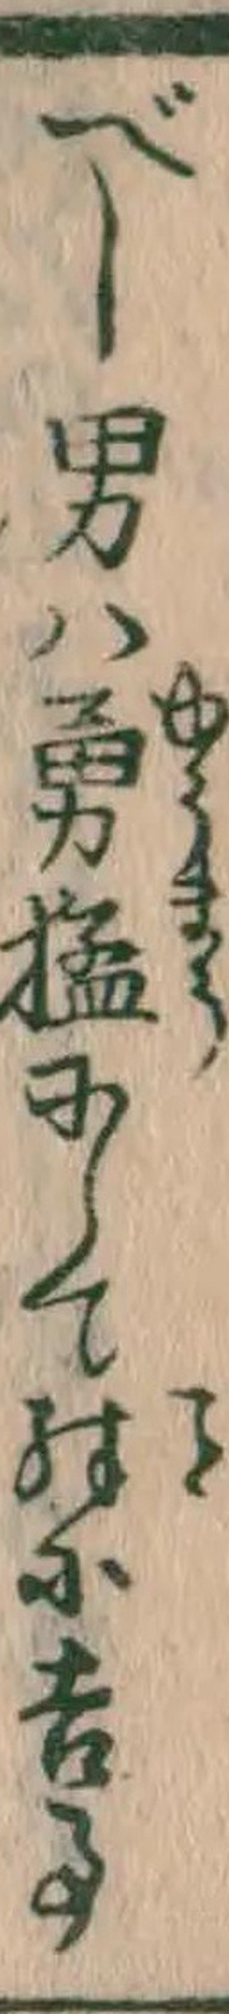べし男は勇猛にして殊に吉事
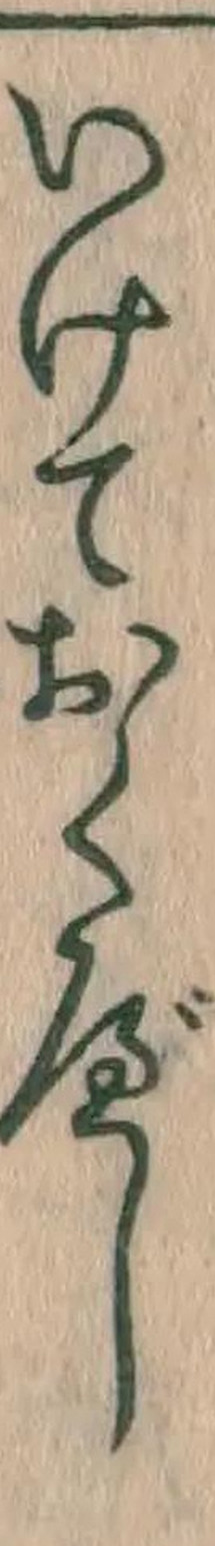いけておくべし
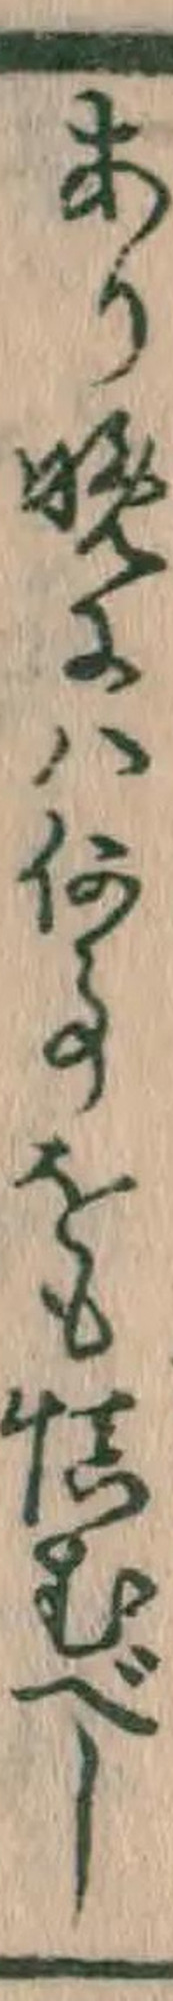あり晩には何事をも慎むべし
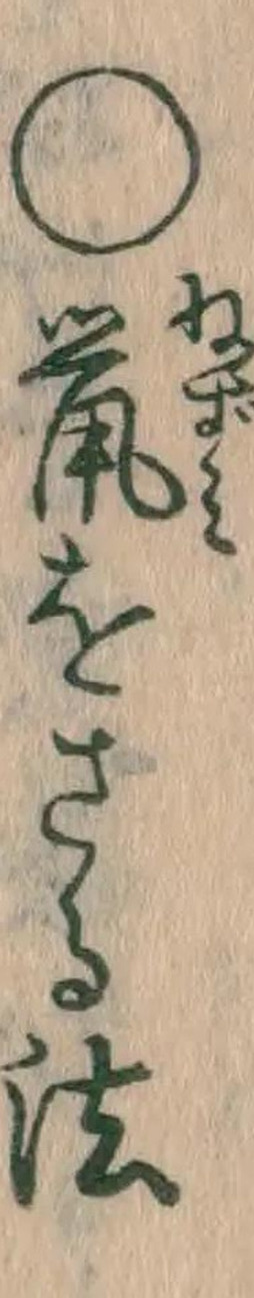○鼠をさる法
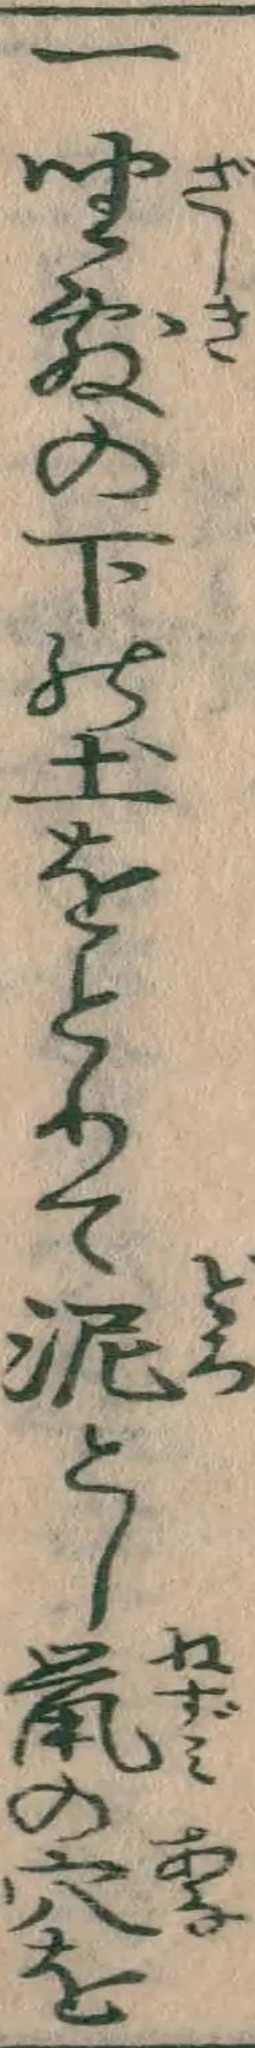一坐敷の下の土をとりて泥とし鼠の穴を
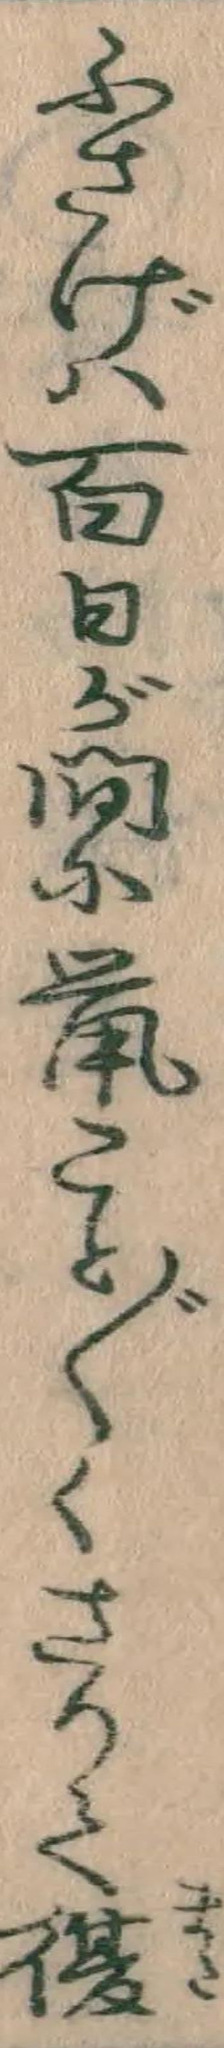ふさげは百日が間に鼠こと〴〵くさりて復
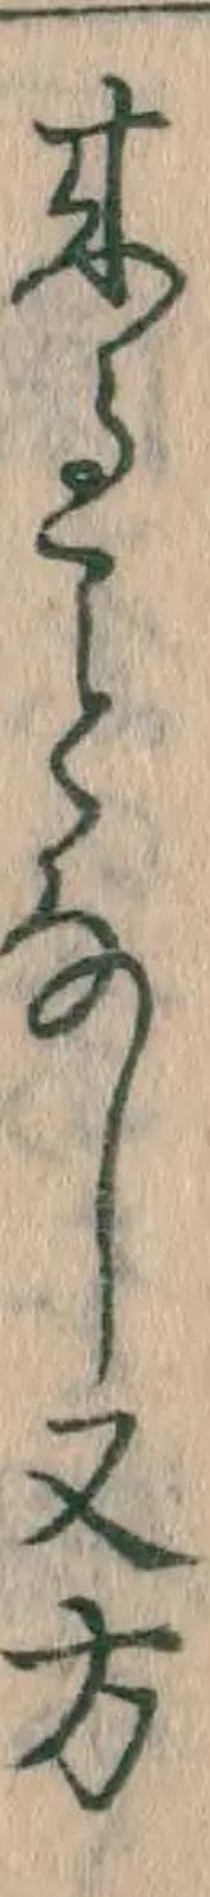来ることなし又方
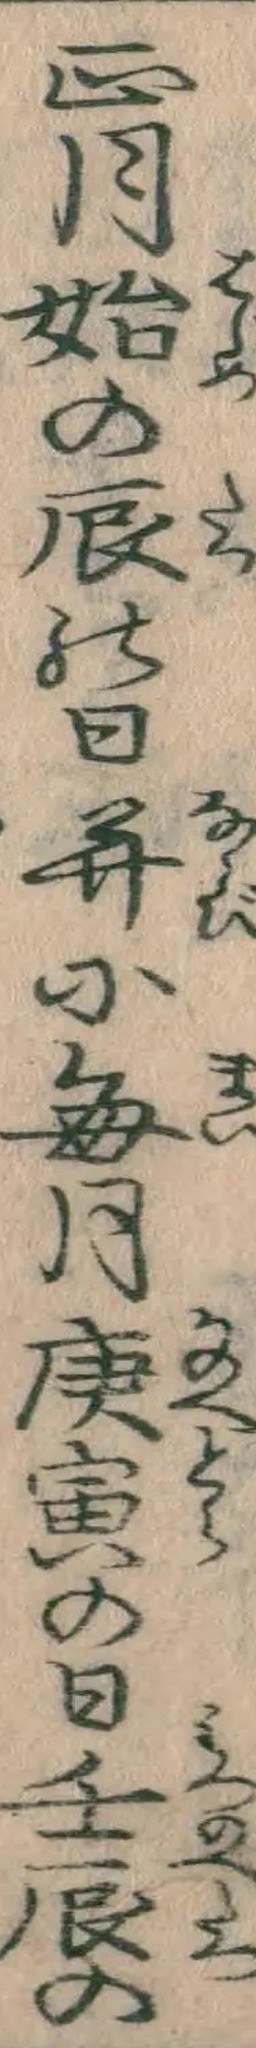正月始の辰の日并に毎月庚寅の日壬辰の
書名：広益秘事大全 3巻. [1]
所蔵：国立国会図書館 National Diet Library, JAPAN
